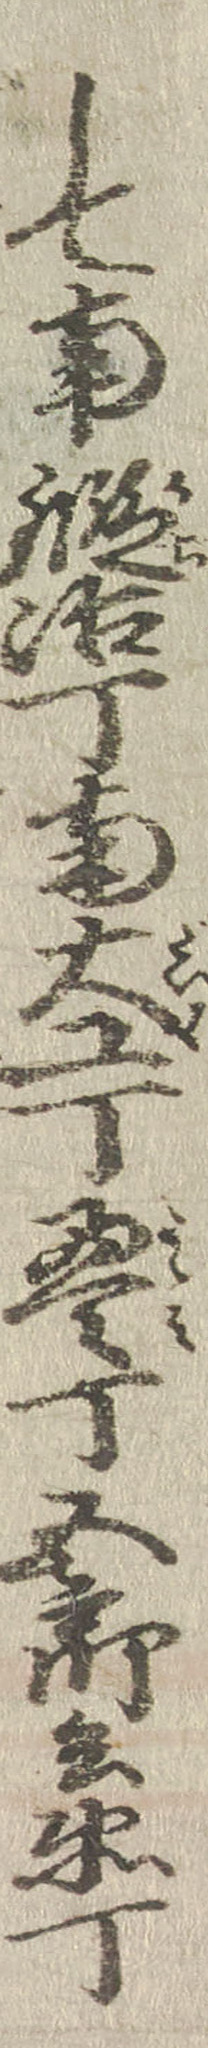して南鍛冶丁南大工丁畳丁五郎兵衛丁
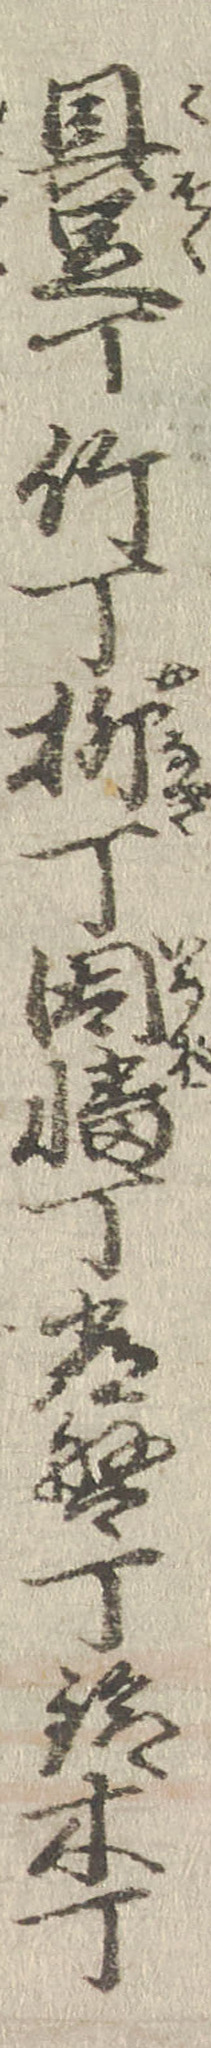具足丁竹下柳丁因幡丁常磐丁鈴木丁
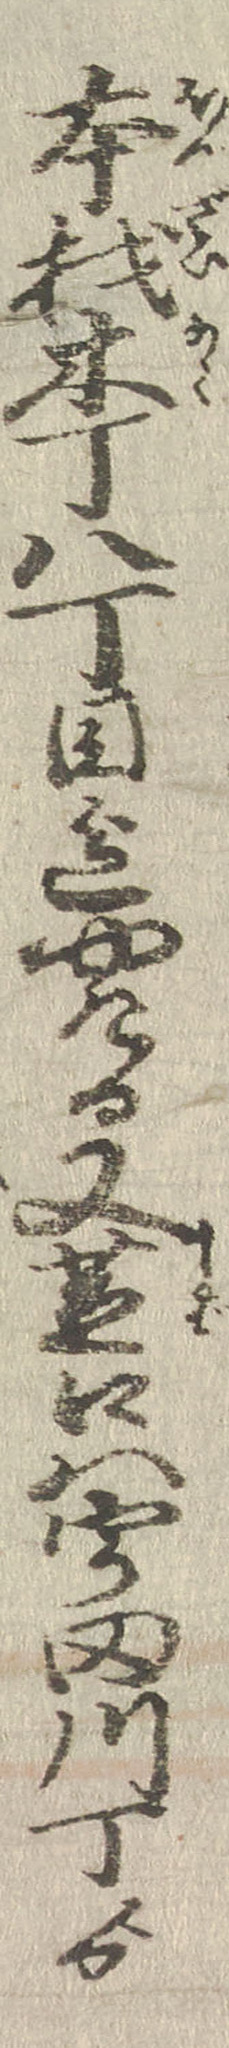本材木丁八丁目迄やける又芝口ハ宇田川丁ゟ
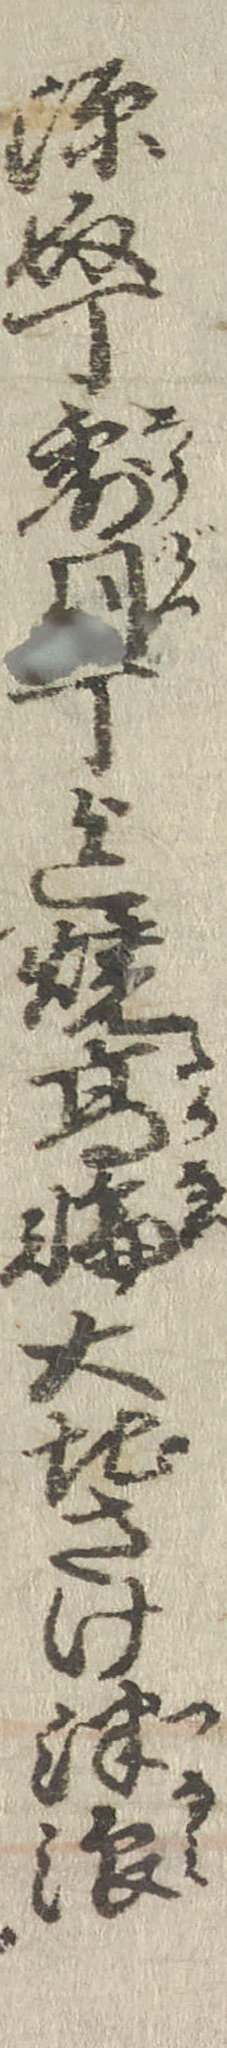源介丁露月丁迄焼高輪大地さけ津浪
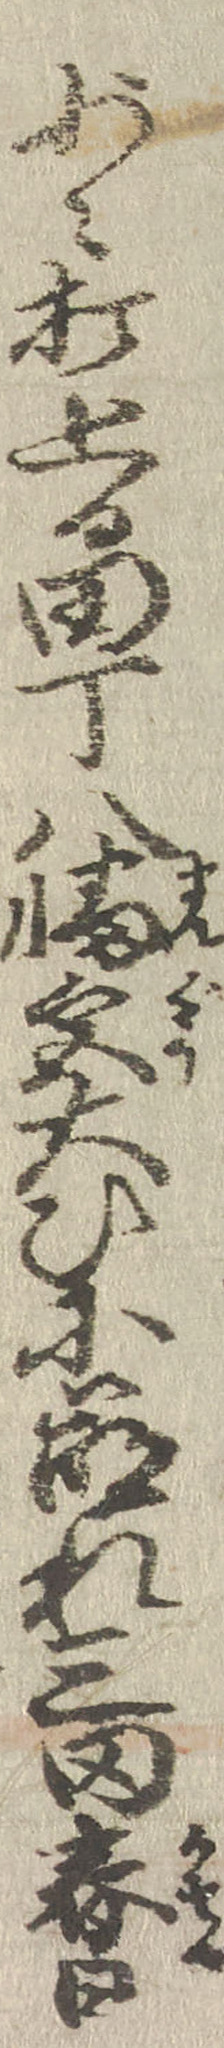少〻打上る田丁八幡宮大ひに崩れ三田春日
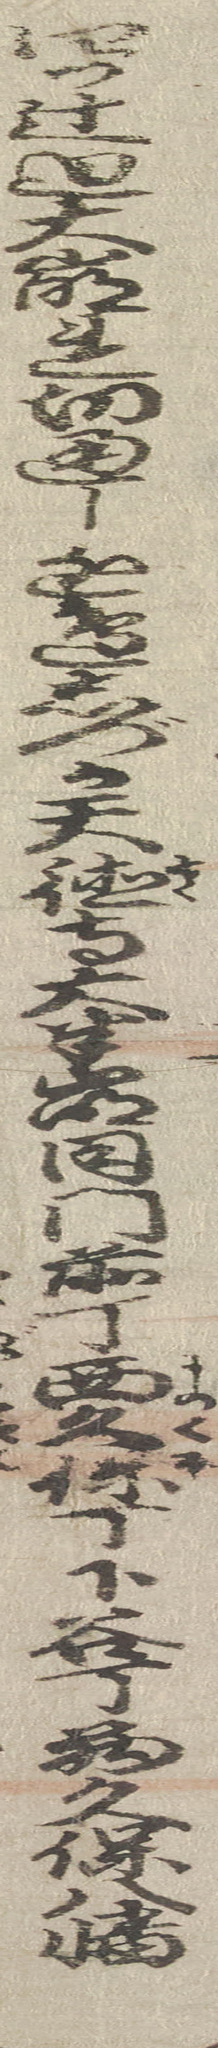四ツ辻辺大崩れ切通し近邊しづか天徳寺大半崩同門前丁西久保丁下谷丁西久保八幡
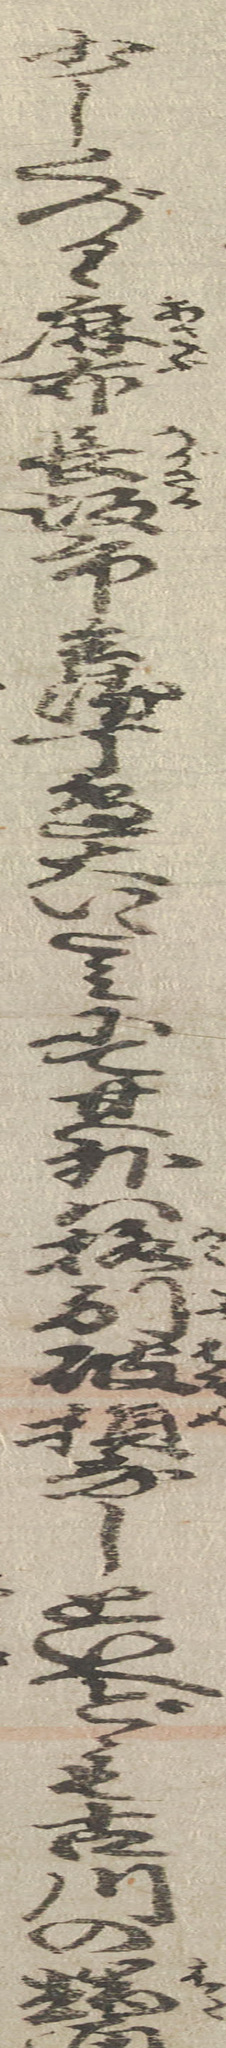少しくづるゝ麻布長坂市兵衛丁邊大いたミにて其外ハ格別破損なしといへども古川の端通り
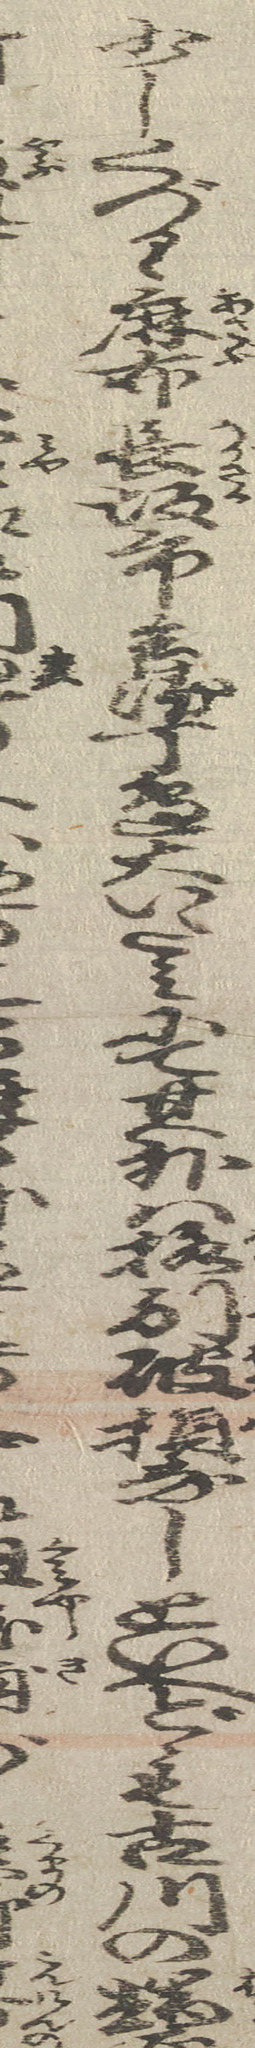少しくづるゝ麻布長坂市兵衛丁邊大いたミにて其外ハ格別破損なしといへども古川の端通り
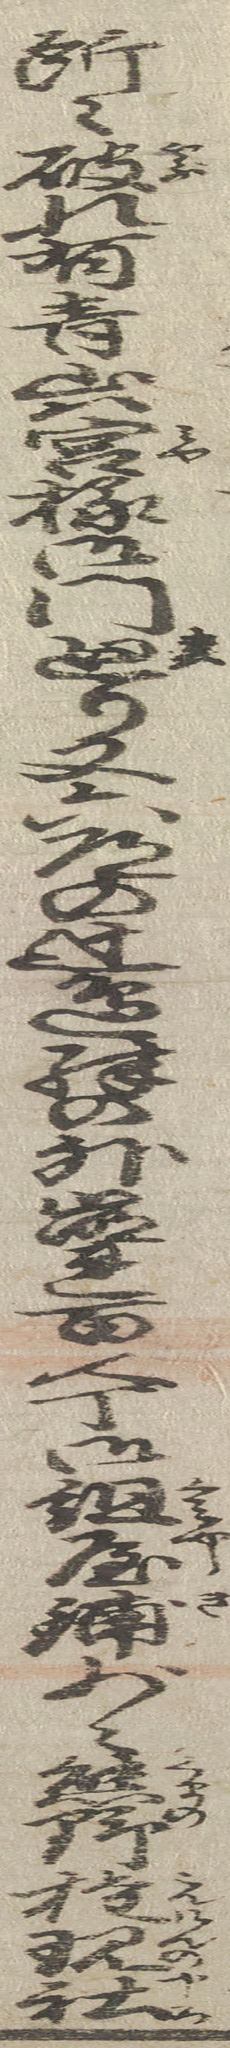所〻破れ有青山ハ宮様御門廻り又六道の辻邊殊の外崩れ百人丁御組屋鋪少〻熊野権現社
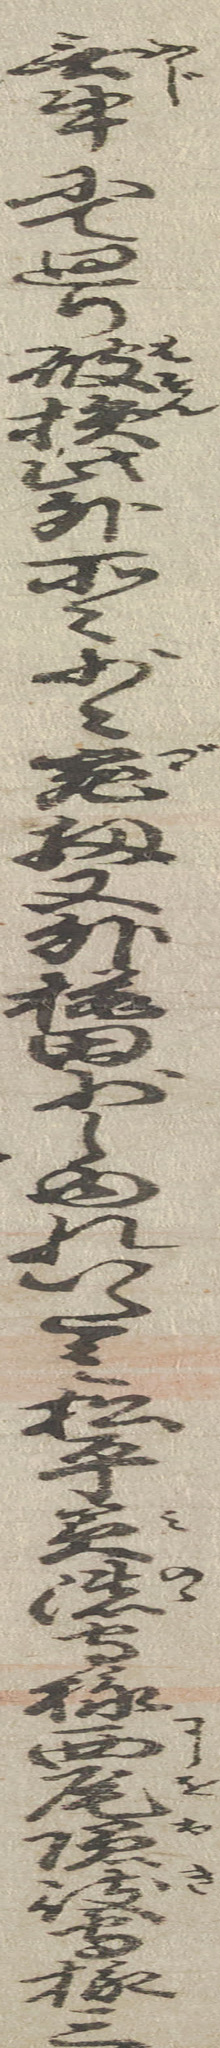無事にて廻り破損此外所〻少〻宛扨又外桜田少しゆれいたミ松平美濃守様西尾隠岐守様三
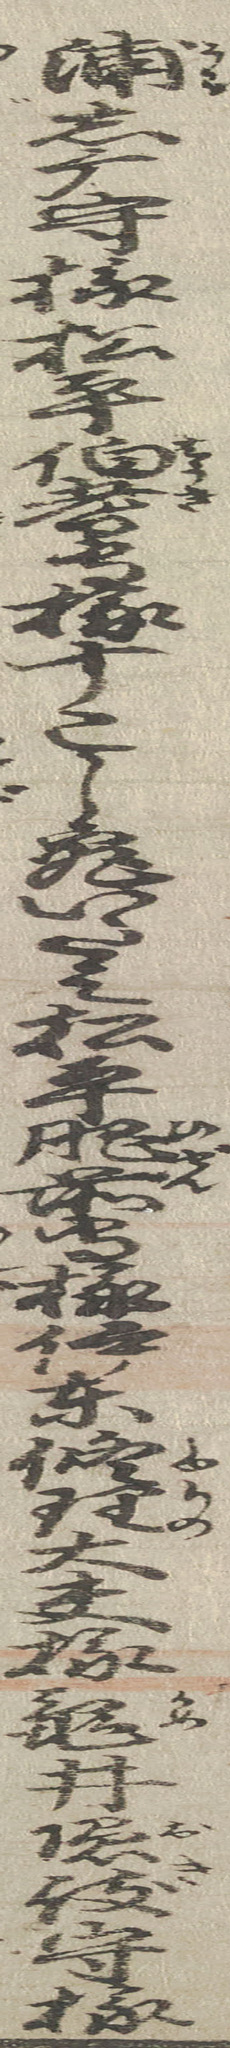浦志广守様松平伯耆守様すこし宛いたミ松平肥前守様伊東修理大夫様亀井隠岐守様
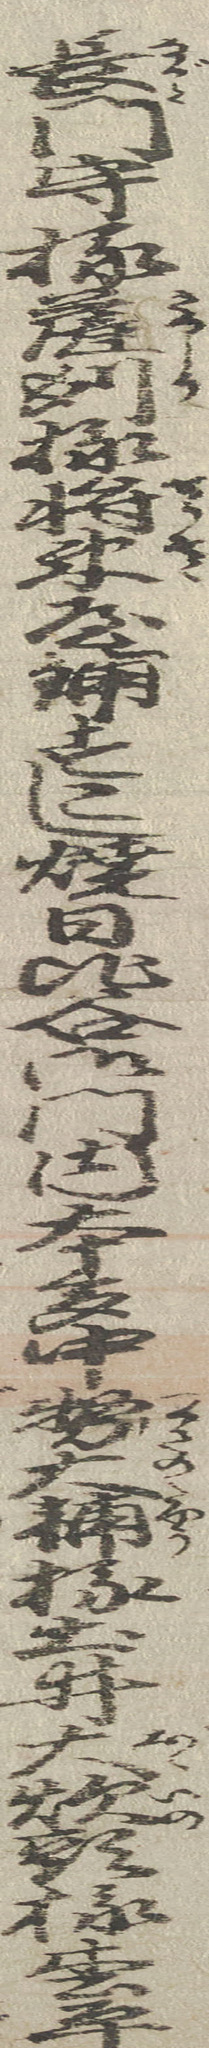長門守様薩州様将束屋鋪すこし焼日比谷御門内本多中務大輔様土井大炊頭様松平
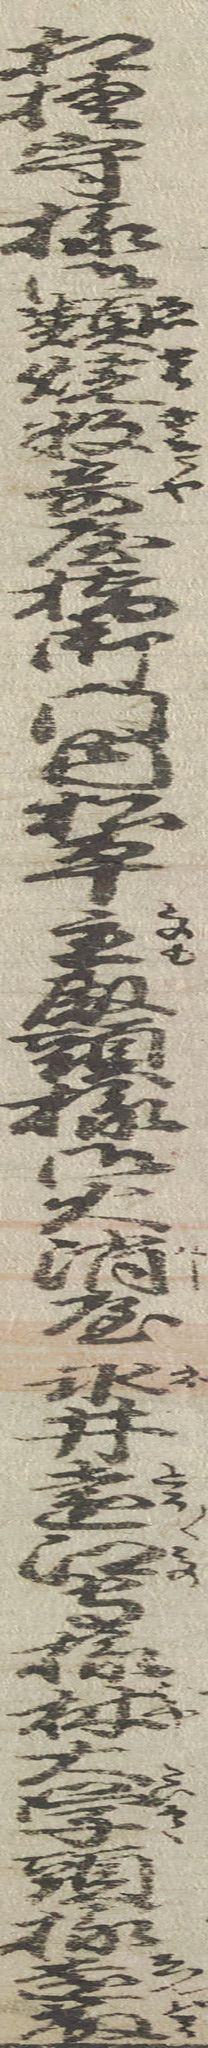相模守様御類焼数寄屋橋御門内松平主殿頭様御火消屋永井遠江守様林大学頭様遠藤
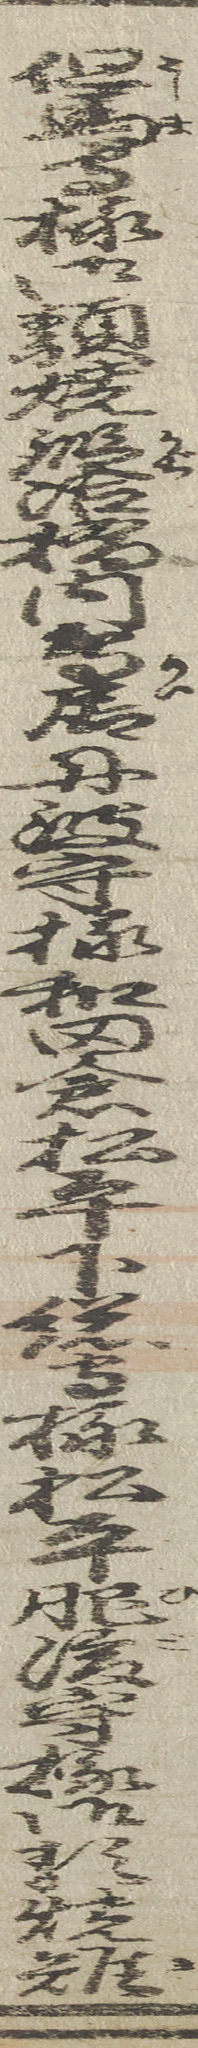但馬守様御類焼鍛冶橋内鳥居丹波守様和田倉松平下総守様松平肥後守様御類焼雉
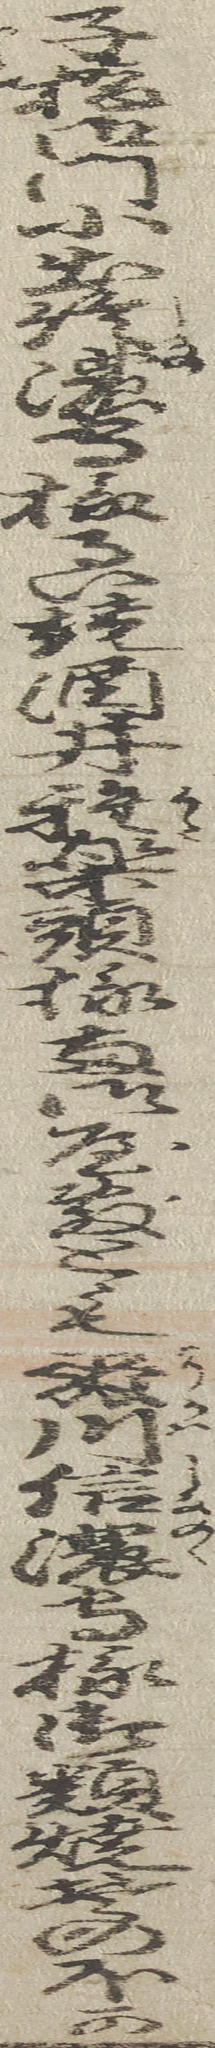子橋御門小出信濃守様るい焼酒井雅楽頭様両御屋敷とも張川信濃守様御類焼そのほか
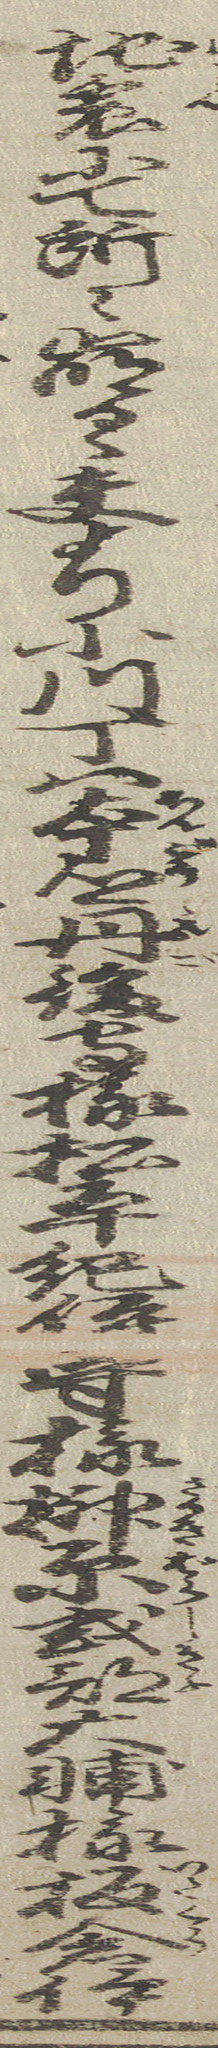地震にて所〻崩るゝ夫より小川丁ハ本郷丹後守様松平紀伊守様榊原式部大輔様板倉伊
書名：ゆるがぬ御代要之石寿栄
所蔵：東京大学総合図書館 General Library in the University of Tokyo, JAPAN
